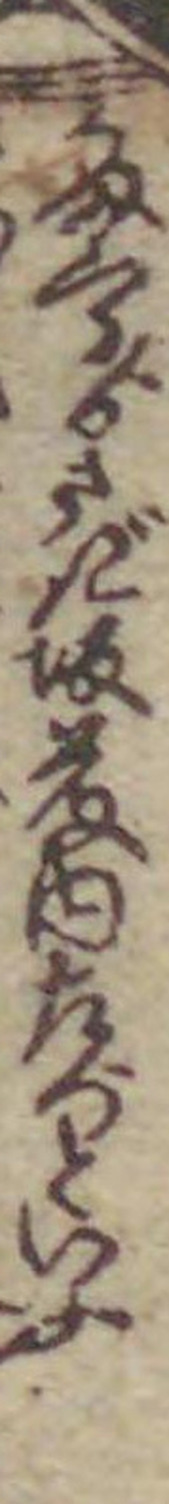かまくらよりさぎ坂藤内左衛門といふ
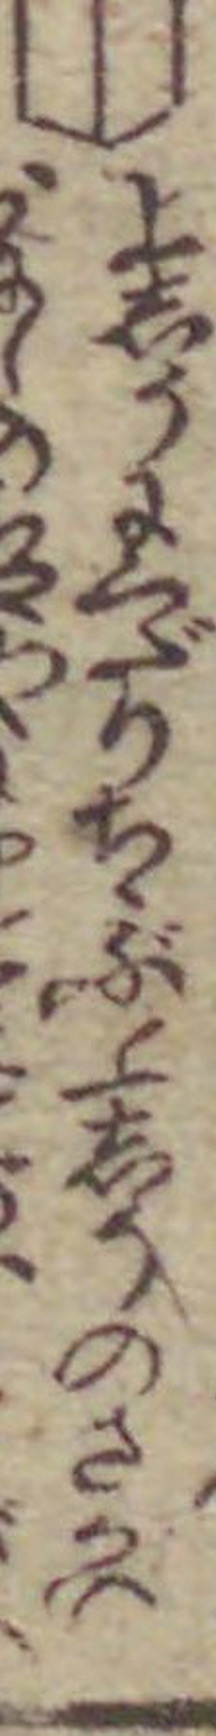上しうにくだりちゝぶ上しうのさかい
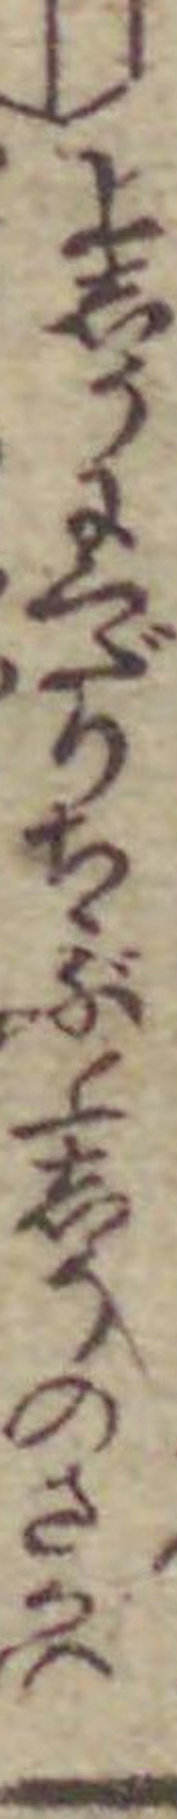上しうにくだりちゝぶ上しうのさかい
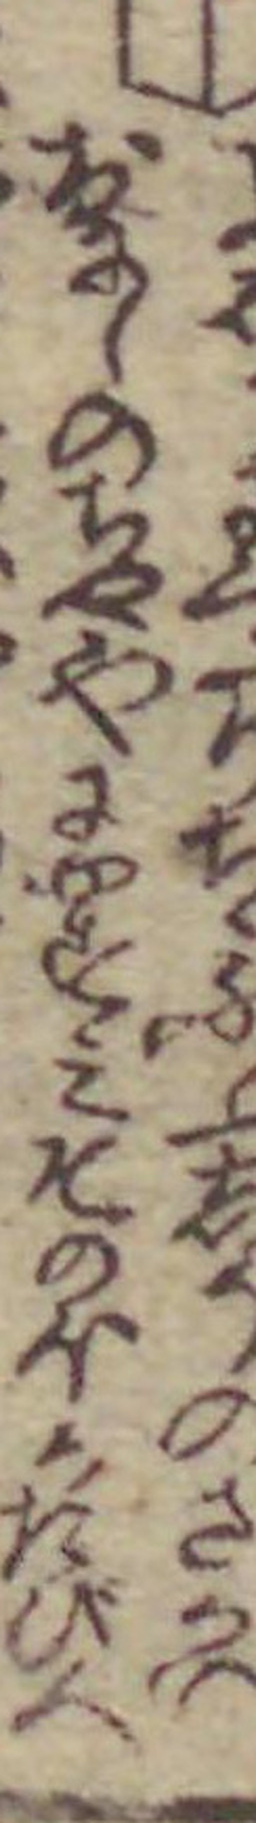おなしのちややにやすみそのほかたび人
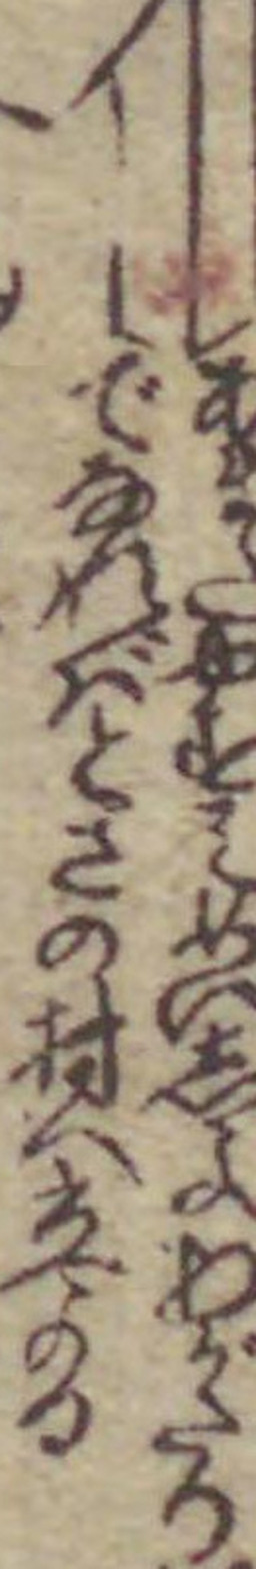でなればとさの村へ立よる
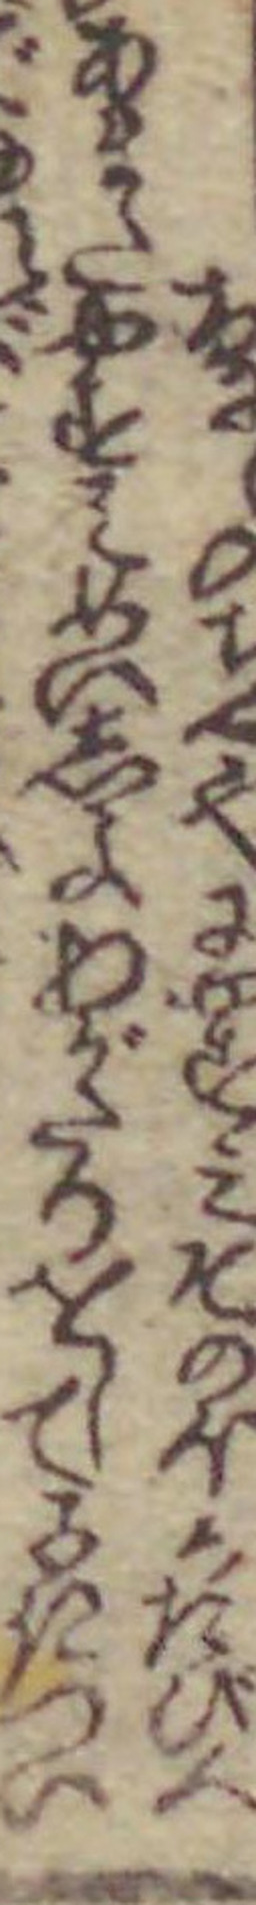あまたやすみめいしよ物がたりをしてきつい
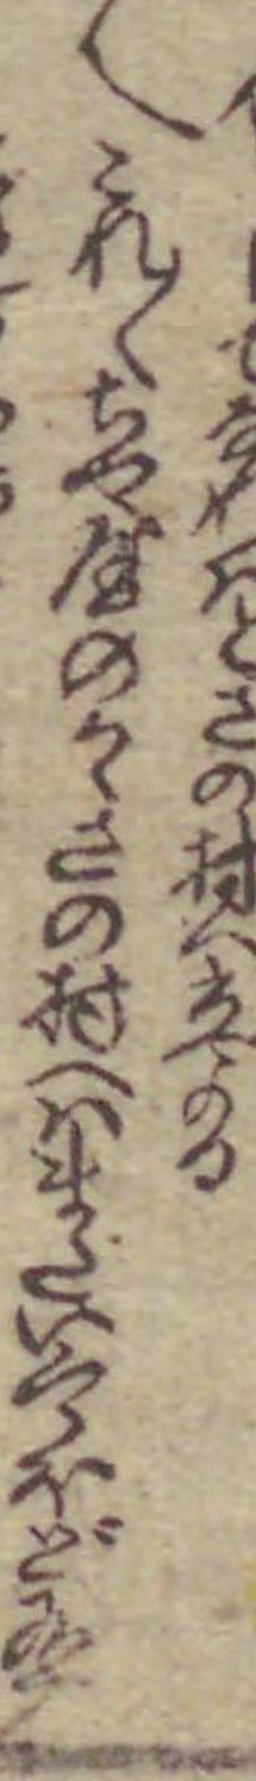これ〳〵ちや屋のかゝさの村へはまたいくらほど有
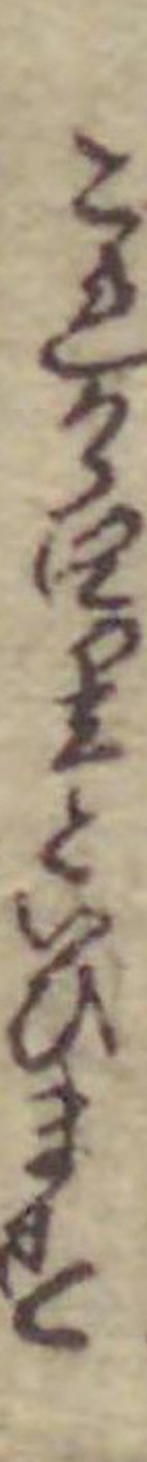これから四里といひます
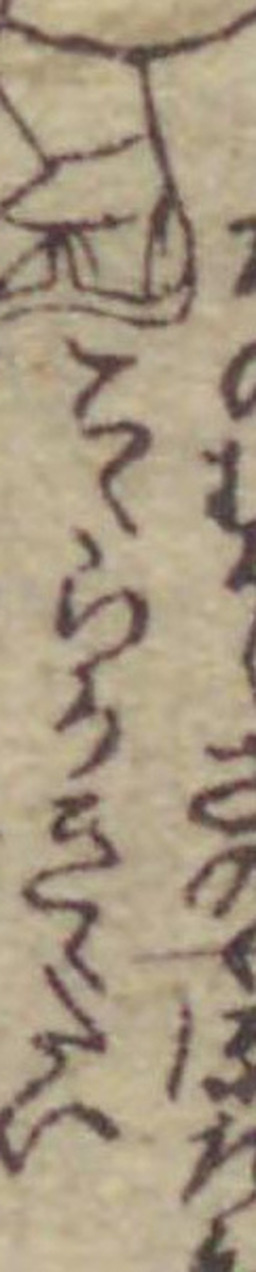こゝらかきゝたい
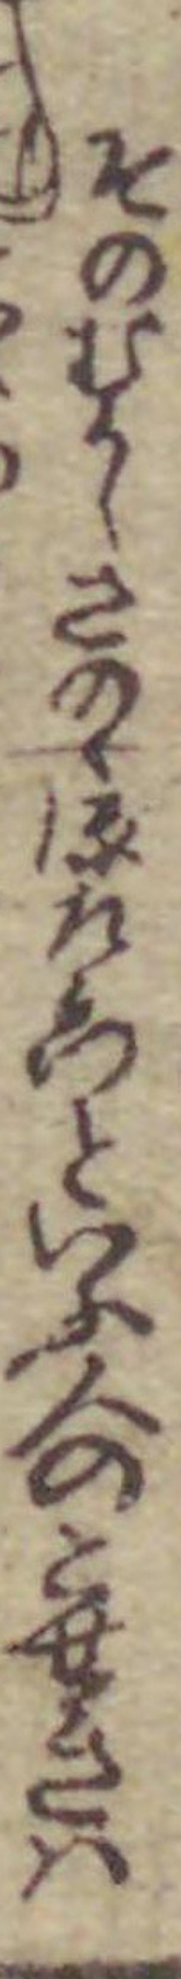そのむかしさのゝ源左衛門といふ人のこせきは
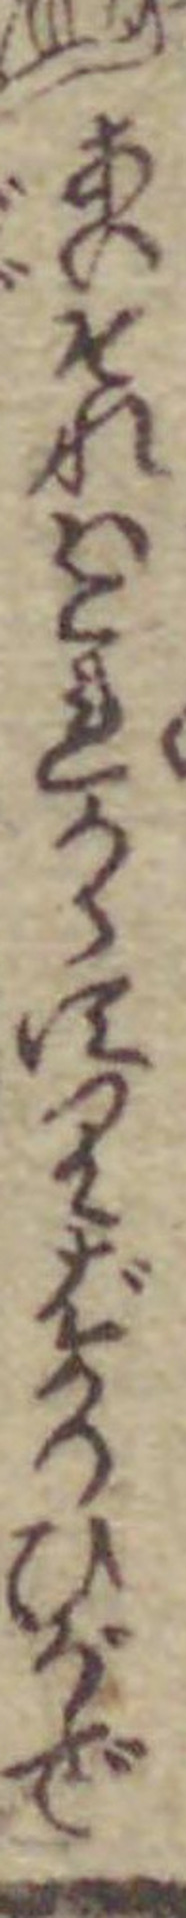あいそれはこれから四里ばかりひがしで
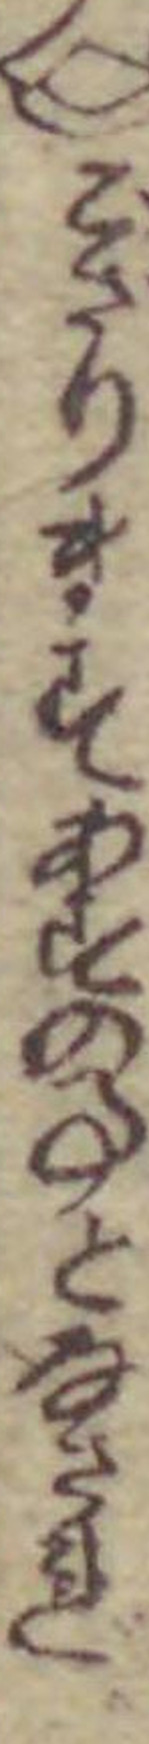ござりますあすの事となされ
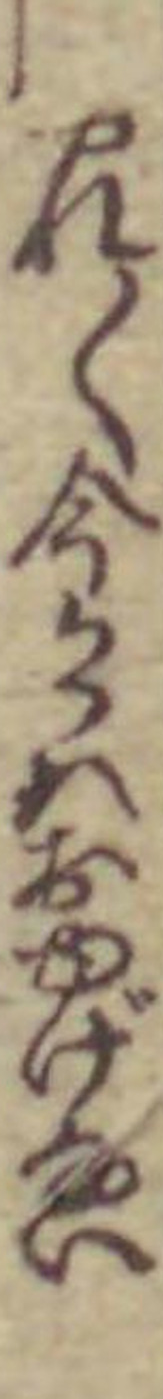やれ〳〵今からはおゆげない
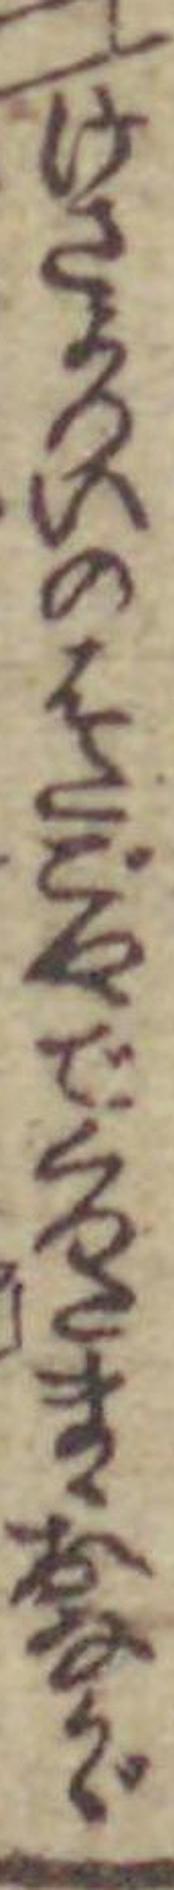けさよりいのはたごやでくつたまゝおなかゞ
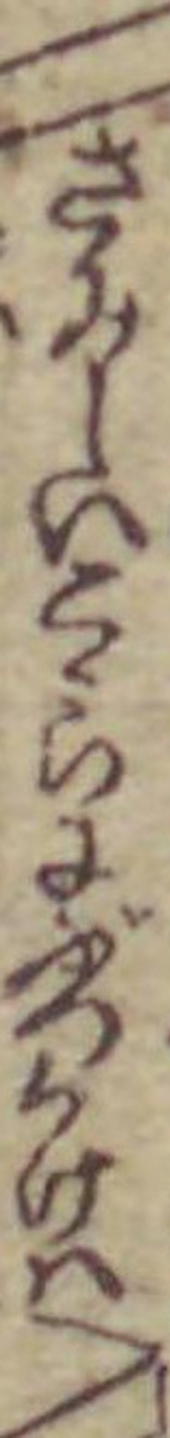さみしいこゝらにぶつかけは
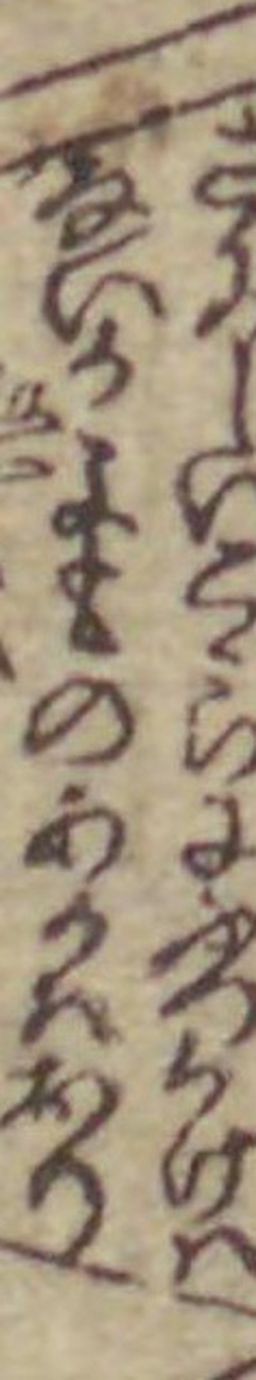ないかよものあかはおり
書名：娜二代鉢木 5巻
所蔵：国立国会図書館 National Diet Library, JAPAN
